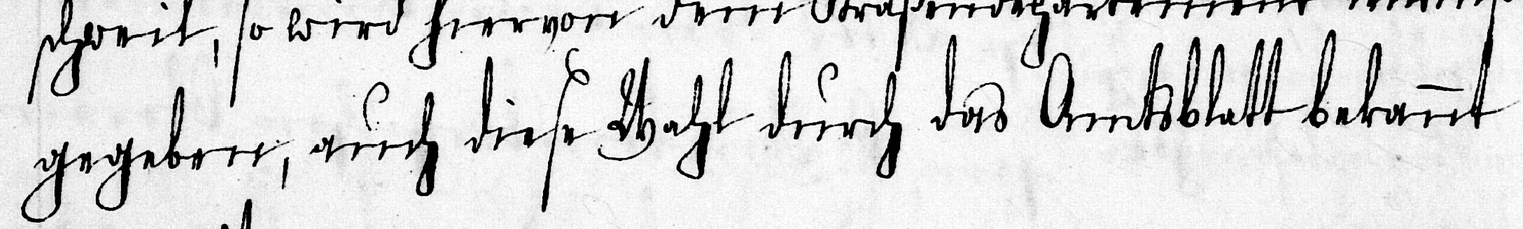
gegeben, auch diese Wahl durch das Amtsblatt bekannt
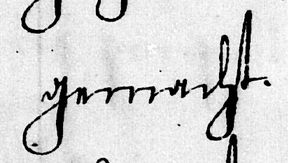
gemacht.
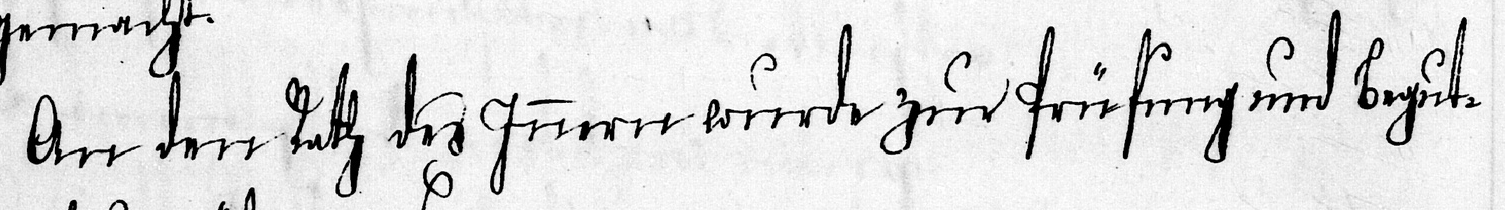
An den Rath des Innern wurde zur Prüfung und Begut¬
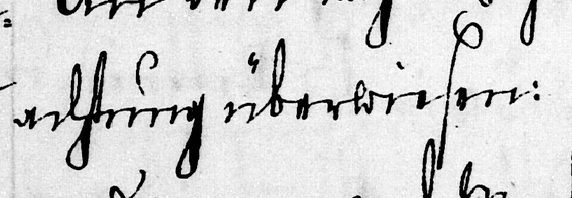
achtung überwiesen:
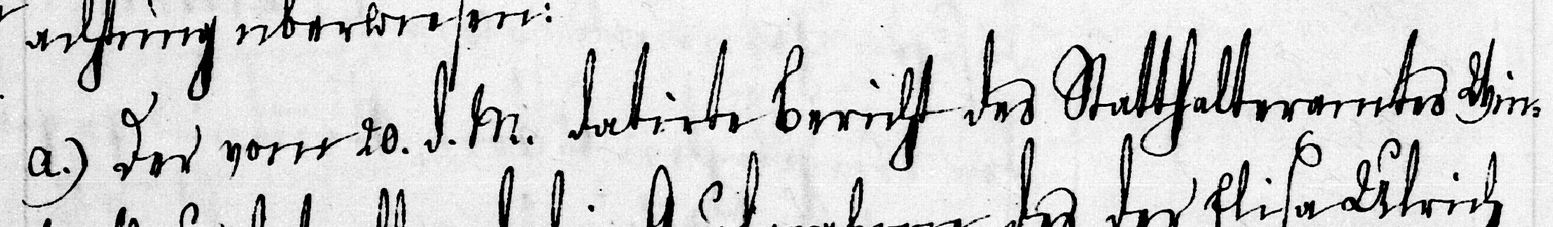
a.) Der vom 20. d. M. datirte Bericht des Statthalteramtes Win¬
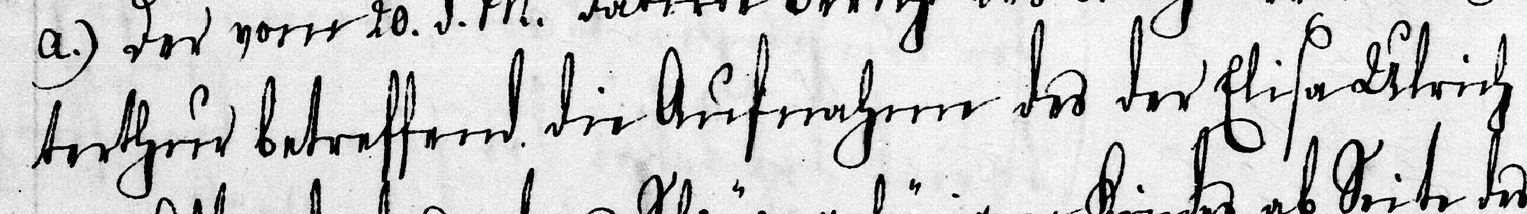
terthur betreffend die Aufnahme des der Elisa Ulrich
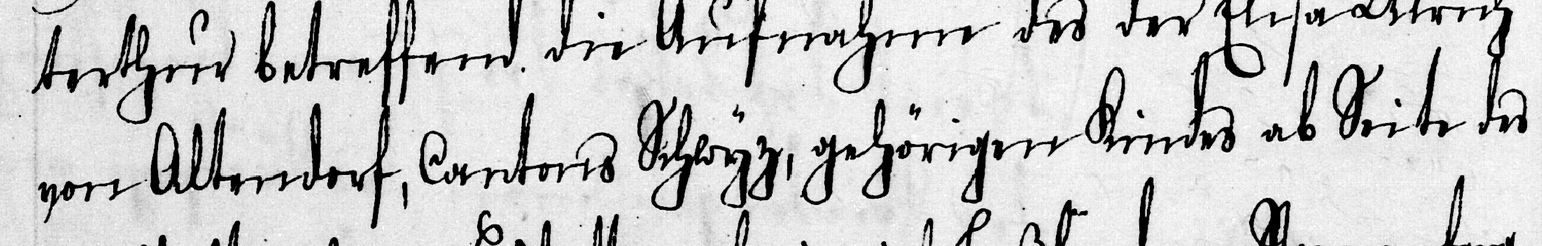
von Altendorf, Cantons Schwyz, gehörigen Kindes ab Seite des
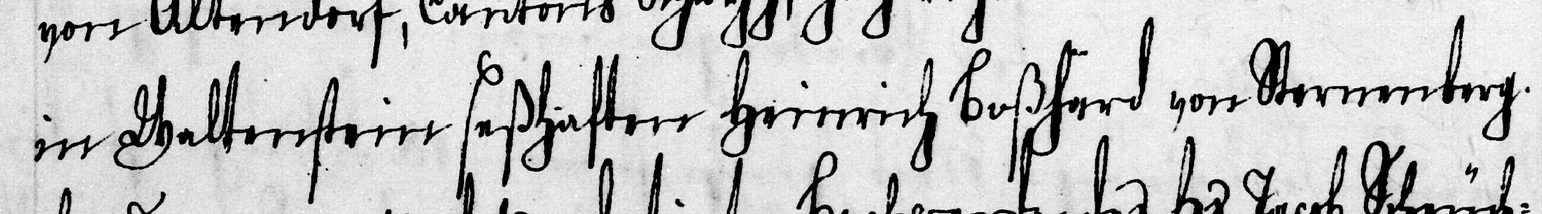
in Waltenstein seßhaften Heinrich Boßhard von Sternenberg.
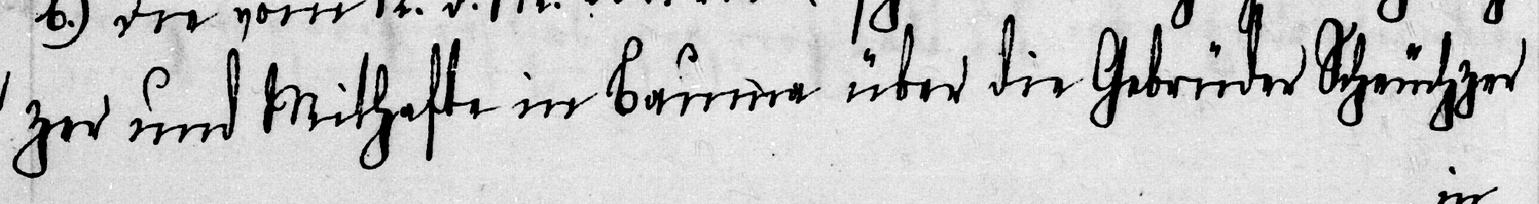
zer und Mithafte in Bauma über die Gebrüder Scheuchzer
